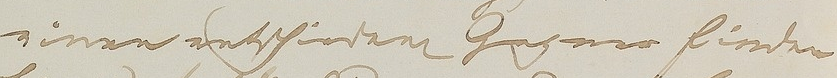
einen entschiedenen Gegner finden
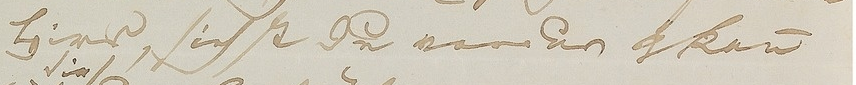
wird, siehst Du voraus & kann
